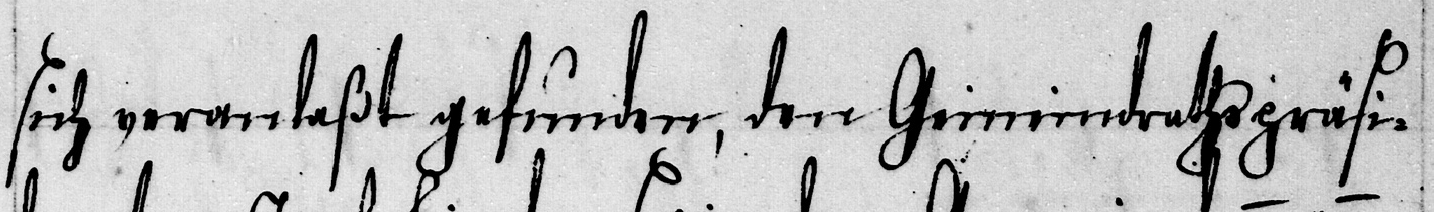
sich veranlaßt gefunden, den Gemeindrathspräsi¬
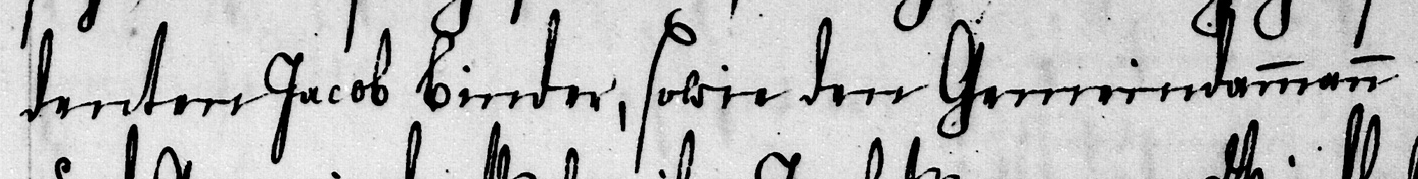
denten Jacob Binder, sowie den Gemeindammann
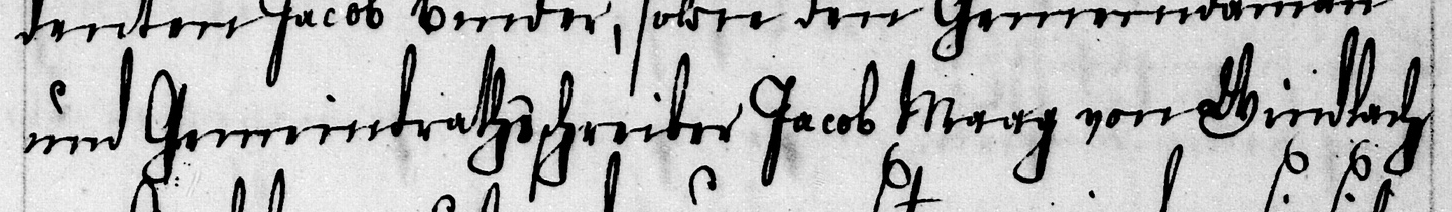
und Gemeindrathsschreiber Jacob Maag von Windlach
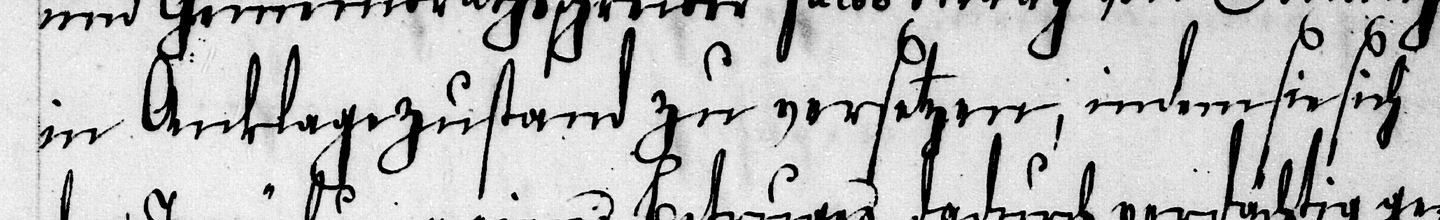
in Anklagezustand zu versetzen, indem sie sich
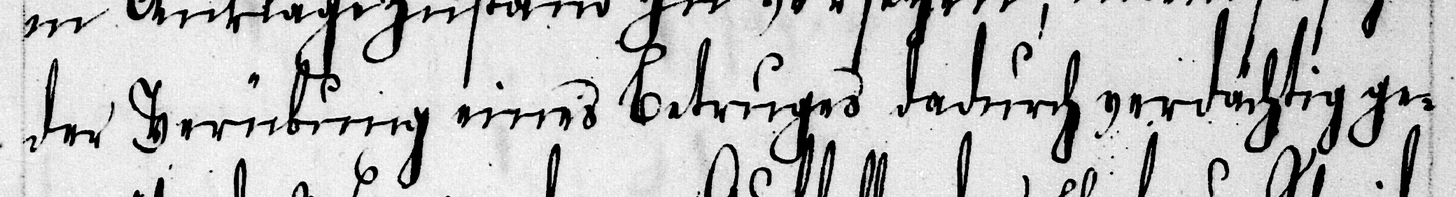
der Verübung eines Betruges dadurch verdächtig ge¬
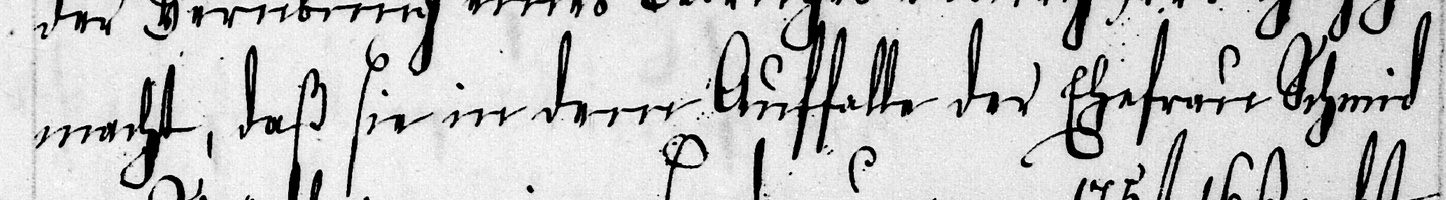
macht, daß sie in dem Auffalle der Ehefrau Schmid
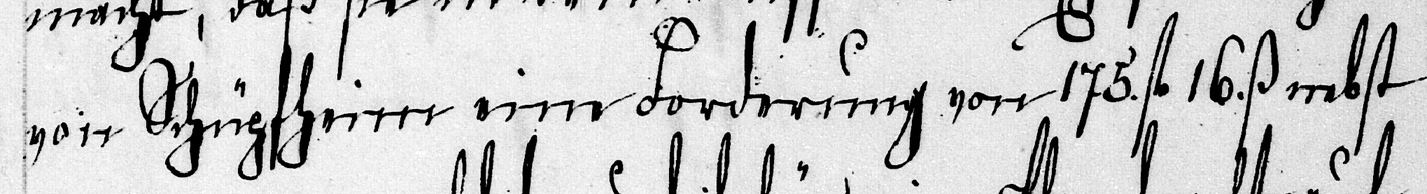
von Schüpfheim eine Forderung von 175. fl 16. ß nebst
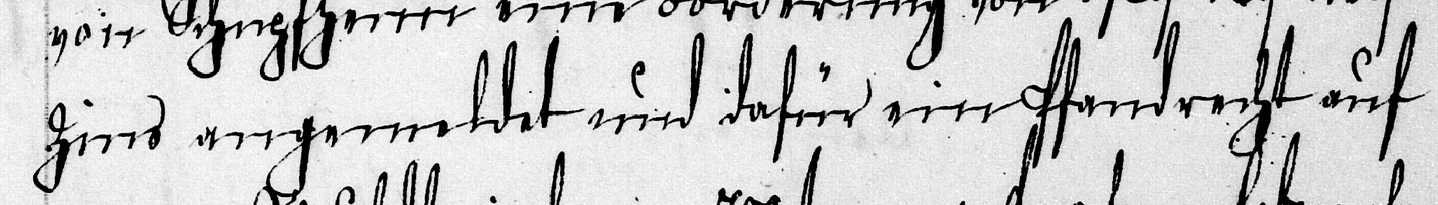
Zins angemeldet und dafür ein Pfandrecht auf
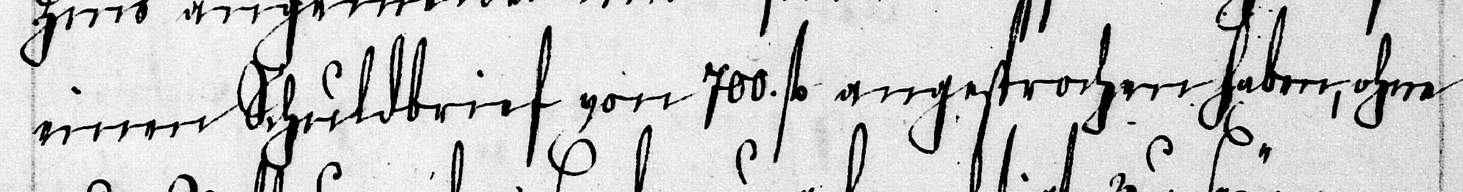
einen Schuldbrief von 700. fl angesprochen haben, ohne
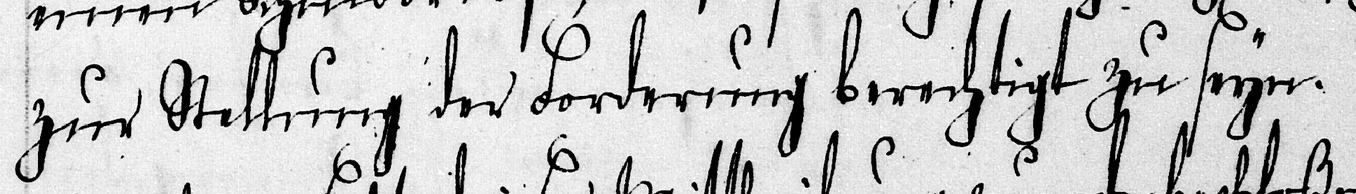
zur Stellung der Forderung berechtigt zu seyn.
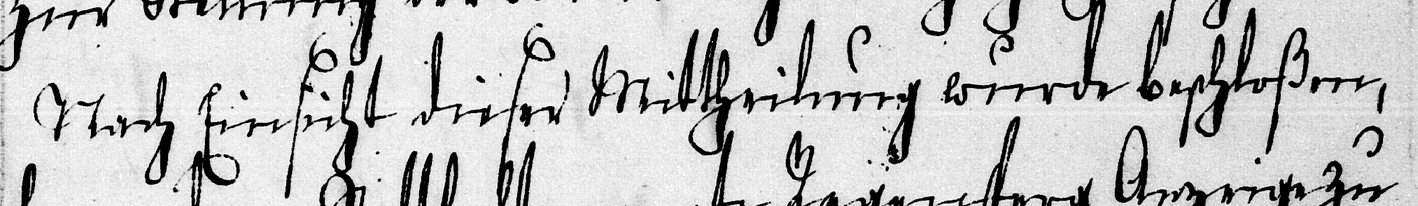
Nach Einsicht dieser Mittheilung wurde beschloßen,
